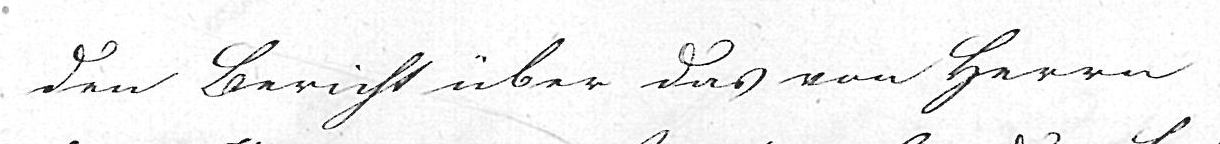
den Bericht über das von Herrn
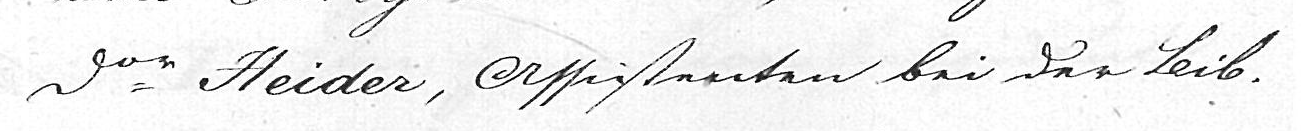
Dor Heider, Assistenten bei der Bib-
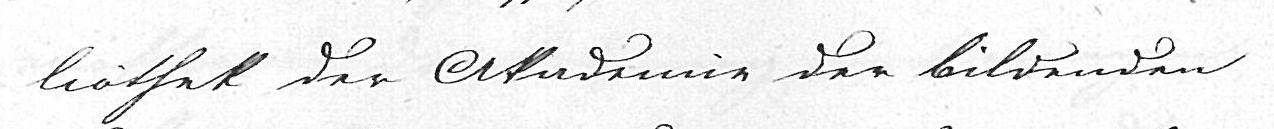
liothek der Akademie der bildenden
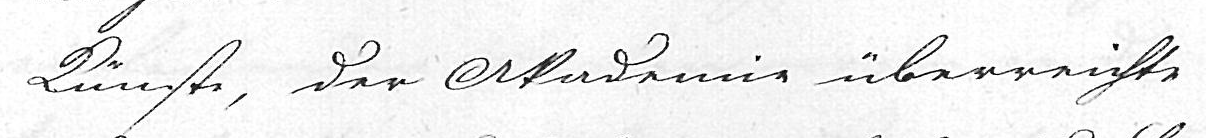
Künste, der Akademie überreichte
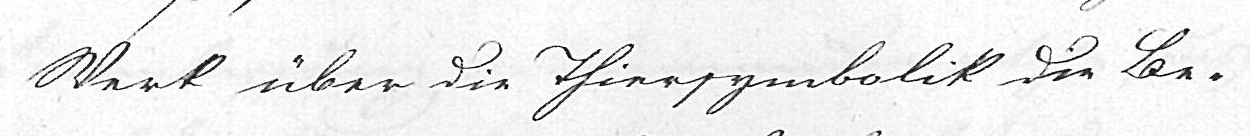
Werk über die Thiersymbolik die Be-
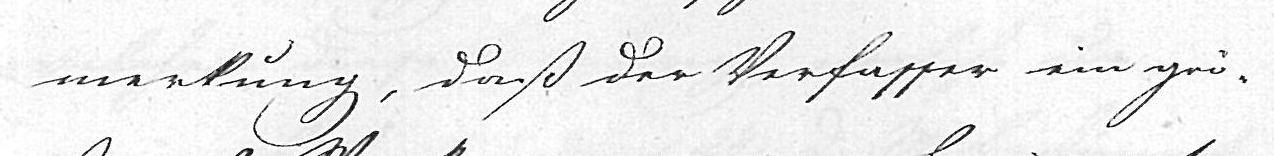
merkung, daß der Verfasser ein grö-
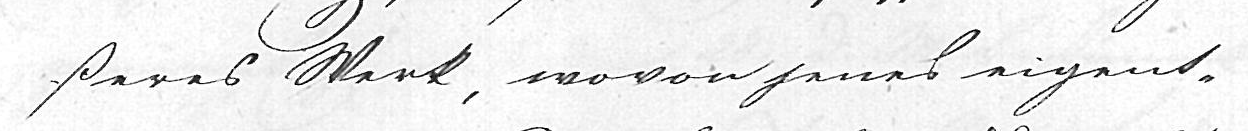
ßeres Werk, wovon jenes eigent-
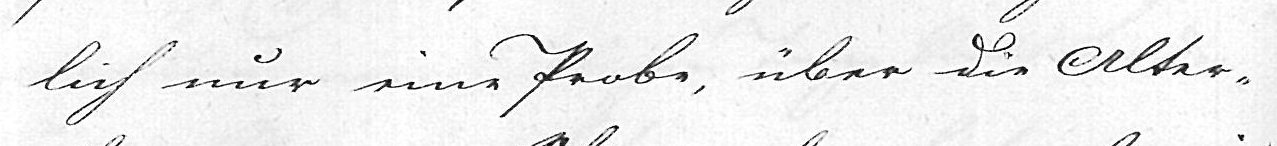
lich nur eine Probe, über die Alter-
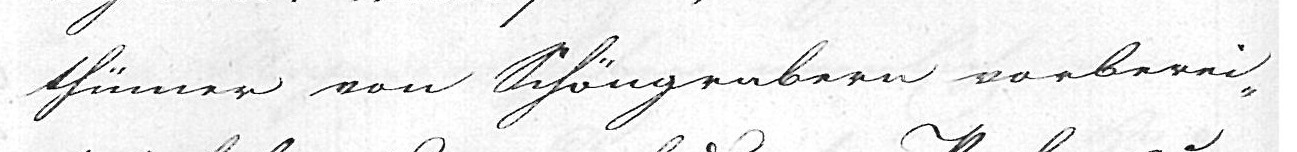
thümer von Schöngrabern vorberei-
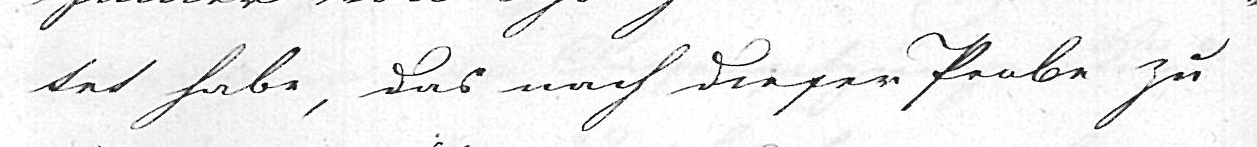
tet habe, das nach dieser Peobe zu
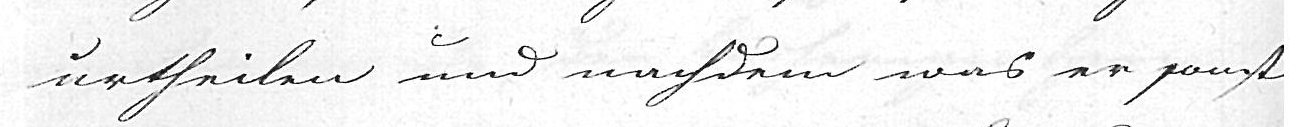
urtheilen und nachdem was er sonst
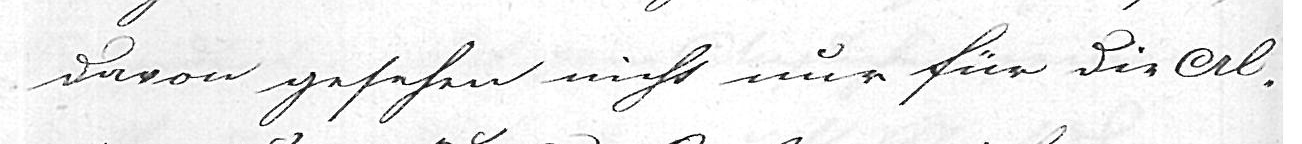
davon gesehen nicht nur für die Al-
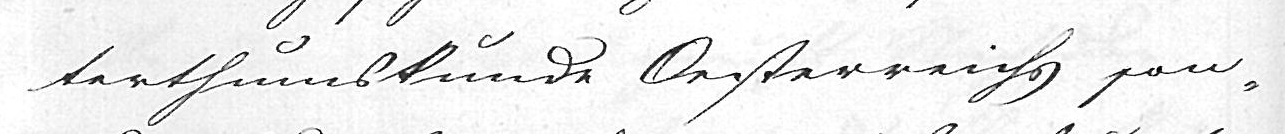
tertumskunde Oesterreichs son-
